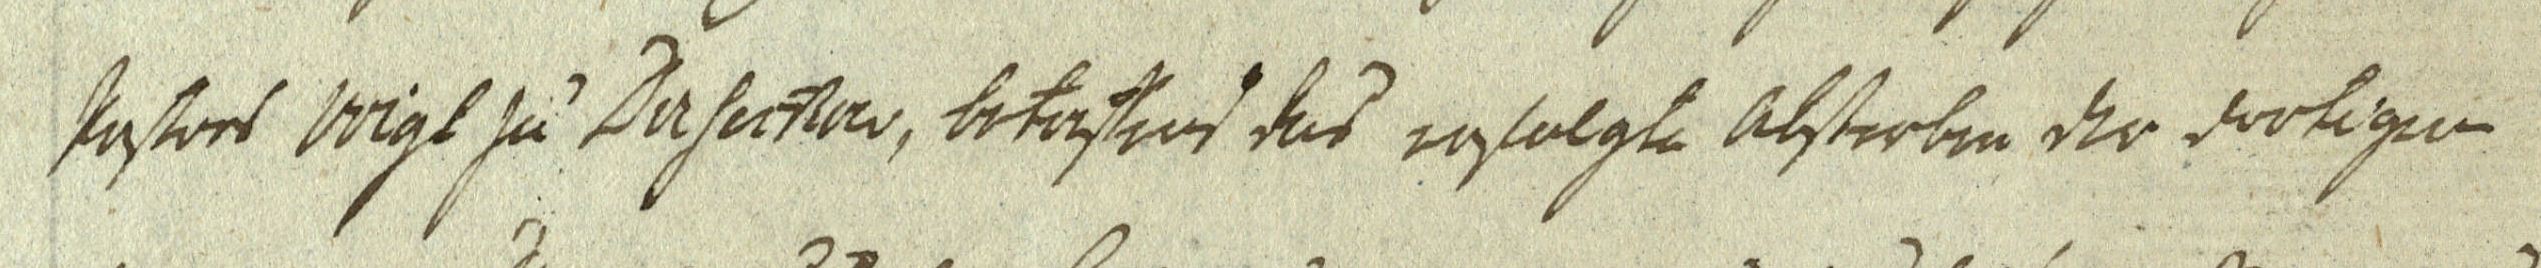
Pastor Voigt zu Dersekow, betreffend das erfolgte Absterben der dortigen
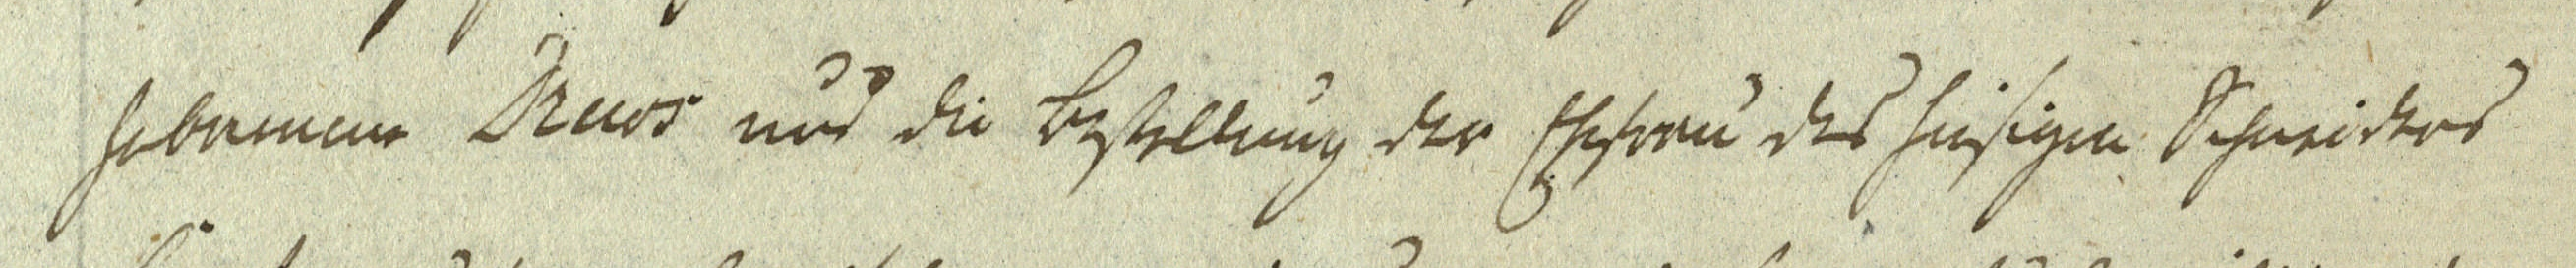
Hebamme Drews und die Bestellung der Ehefrau des hiesigen Schneiders
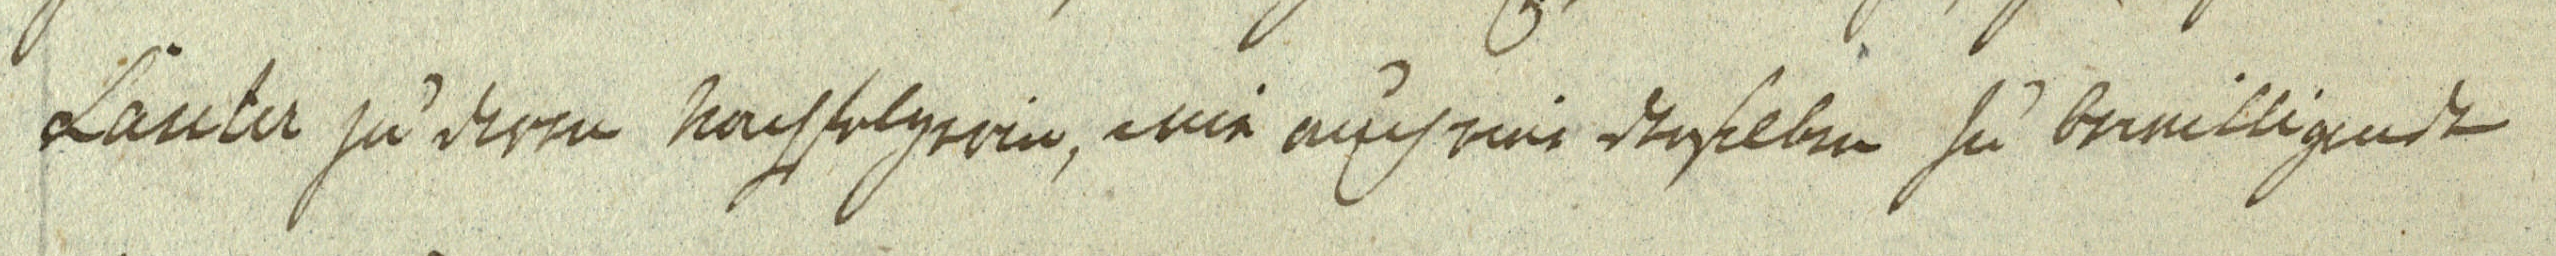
Lauter zu deren Nachfolgerin, wie auch eine derselben zu bewilligende
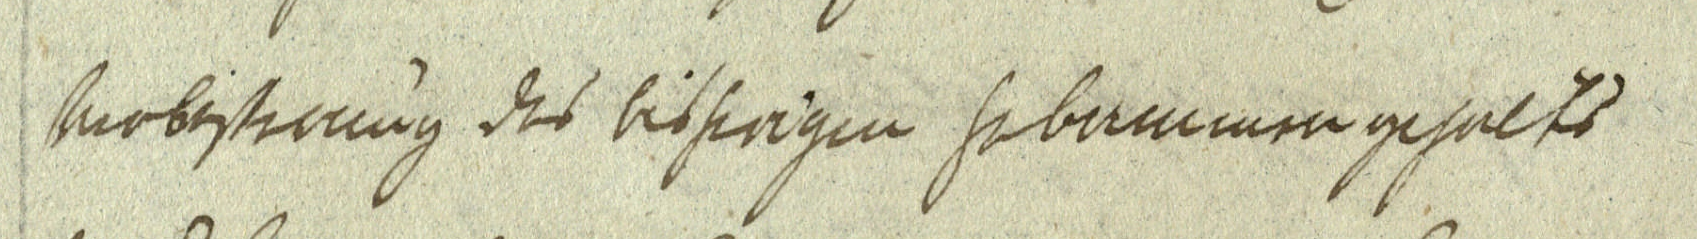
Verbesserung des bisherigen Hebammengehalts
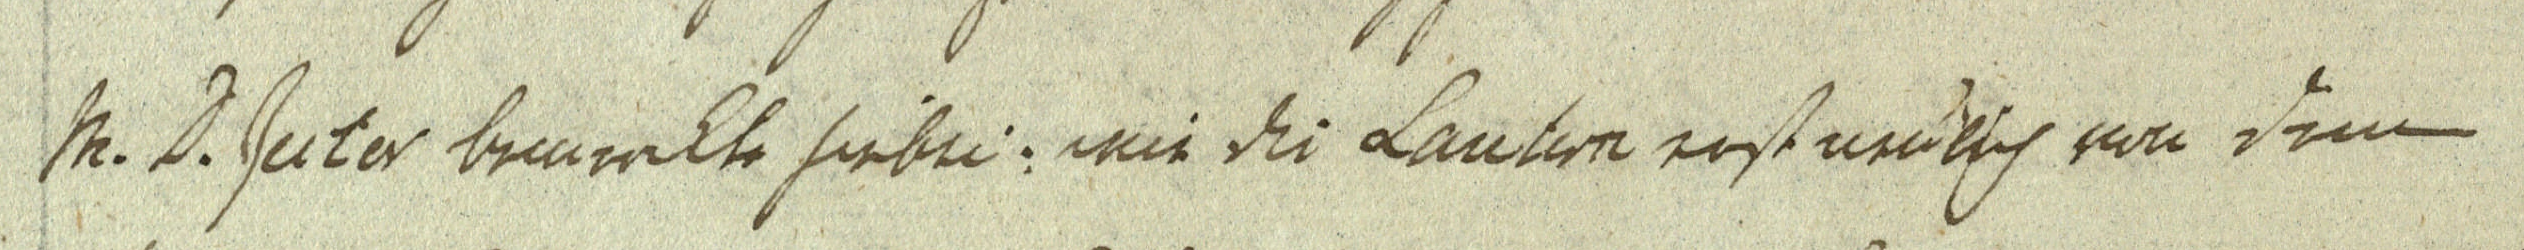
M. D. Rector bemerkte hiebei: wie die Lautern erst neulich von dem
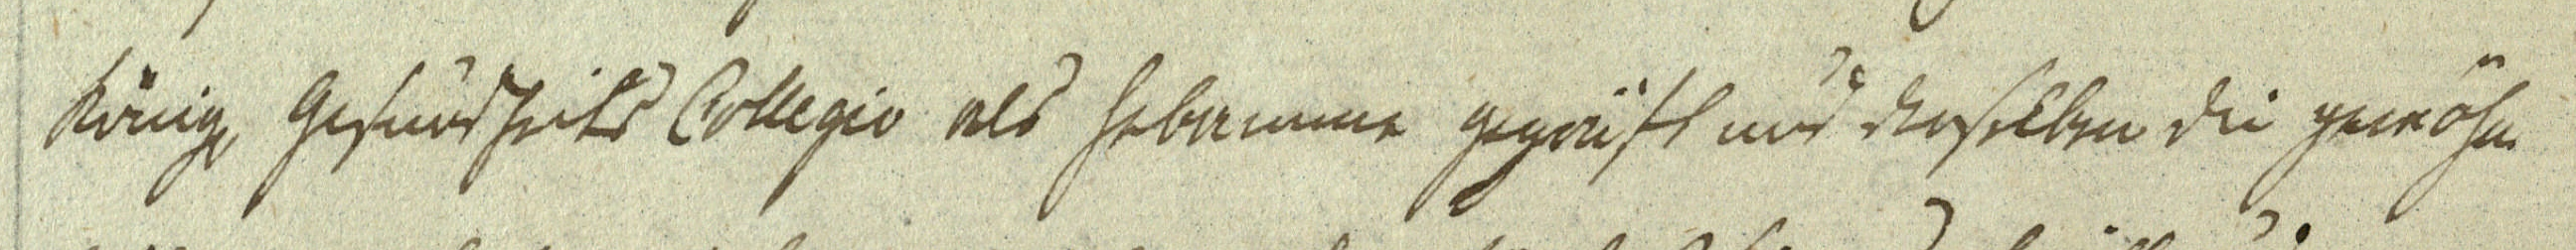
Königl Gesundheits Collegio als Hebamme geprüft und derselben die gewöhn¬
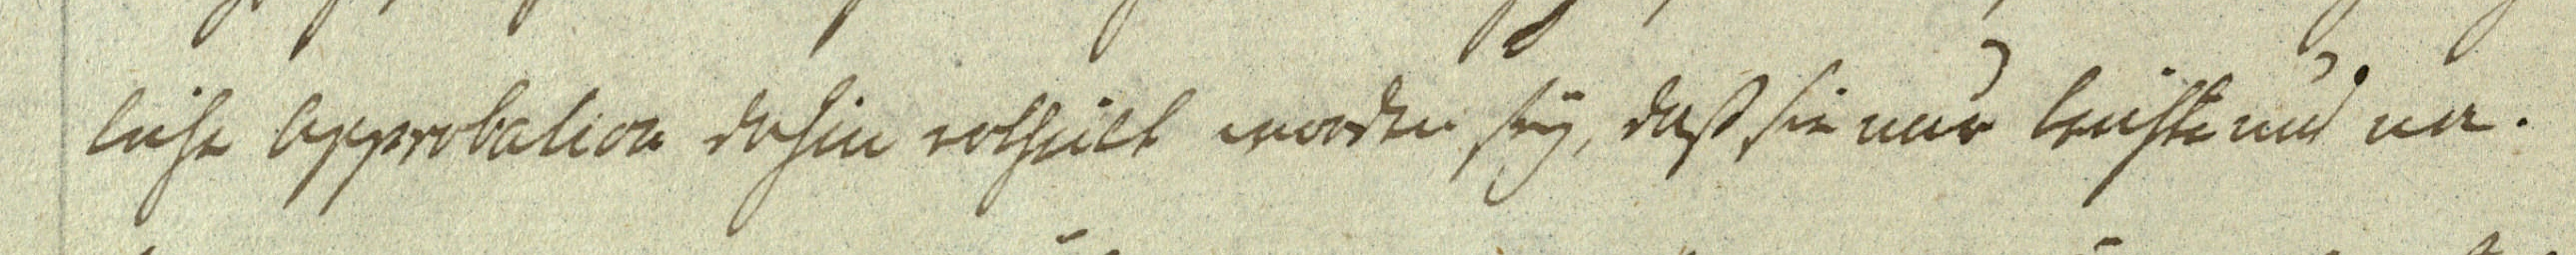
liche Approbation dahin ertheilt worden seÿ, daß sie nur leichte und na¬
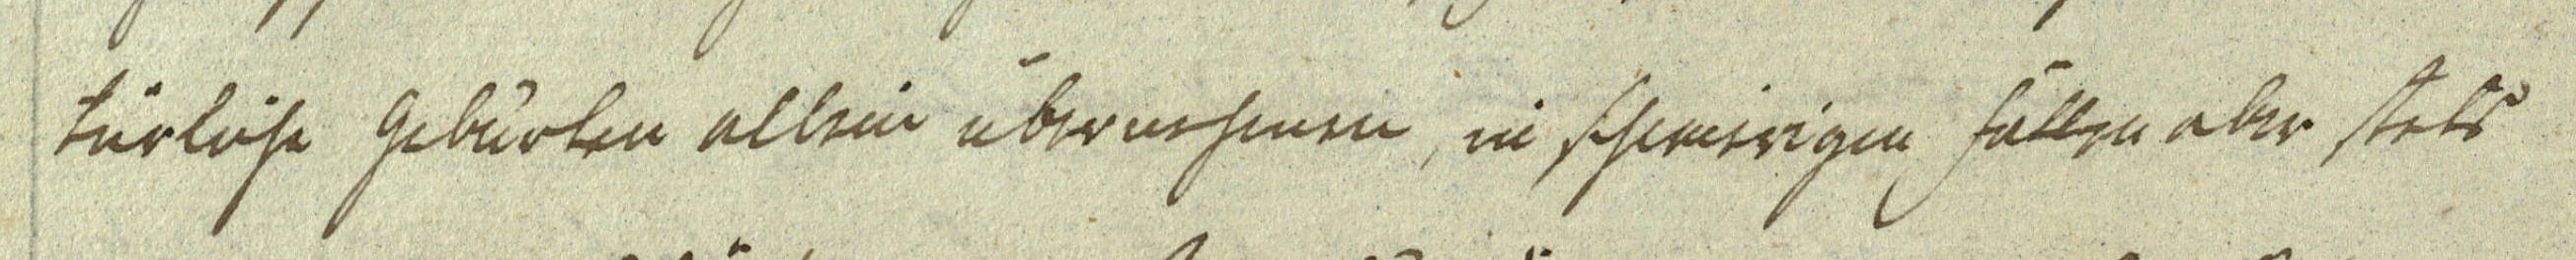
türliche Geburten allein übernehmen, in schwierigen Fällen aber stets
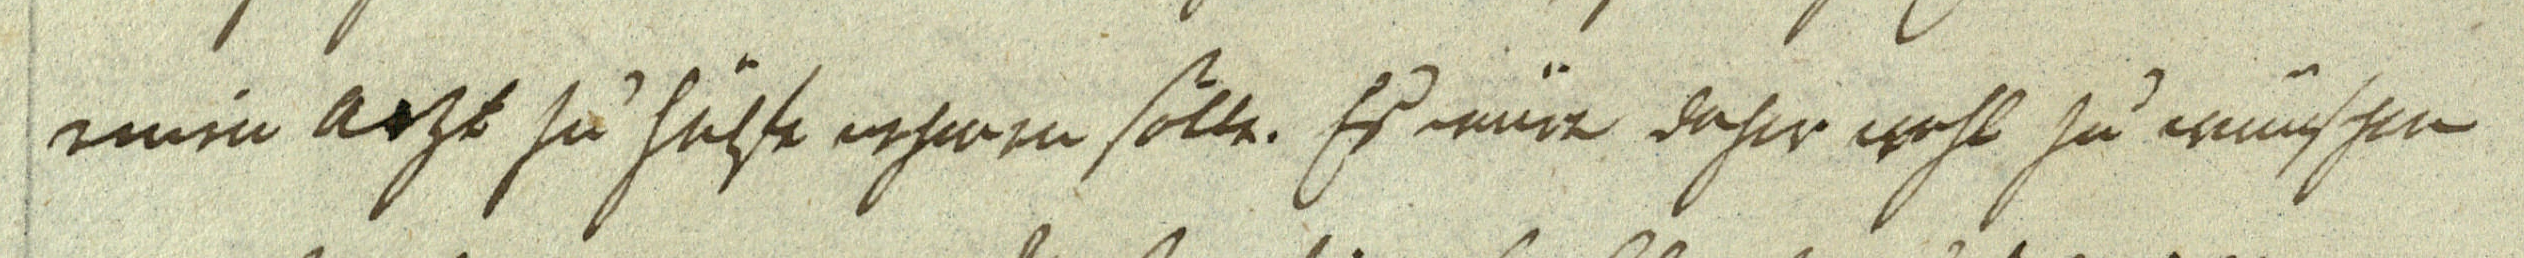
einen Arzt zu Hülfe nehmen solle. Es wäre daher wohl zu wünschen
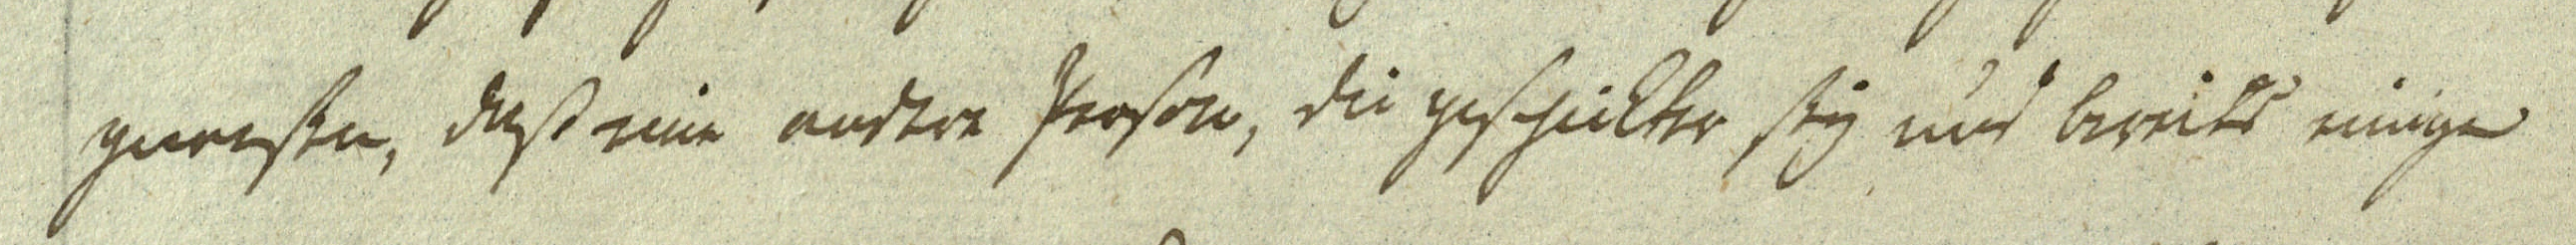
gewesen, daß eine andere Person, die geschickter seÿ und bereits einige
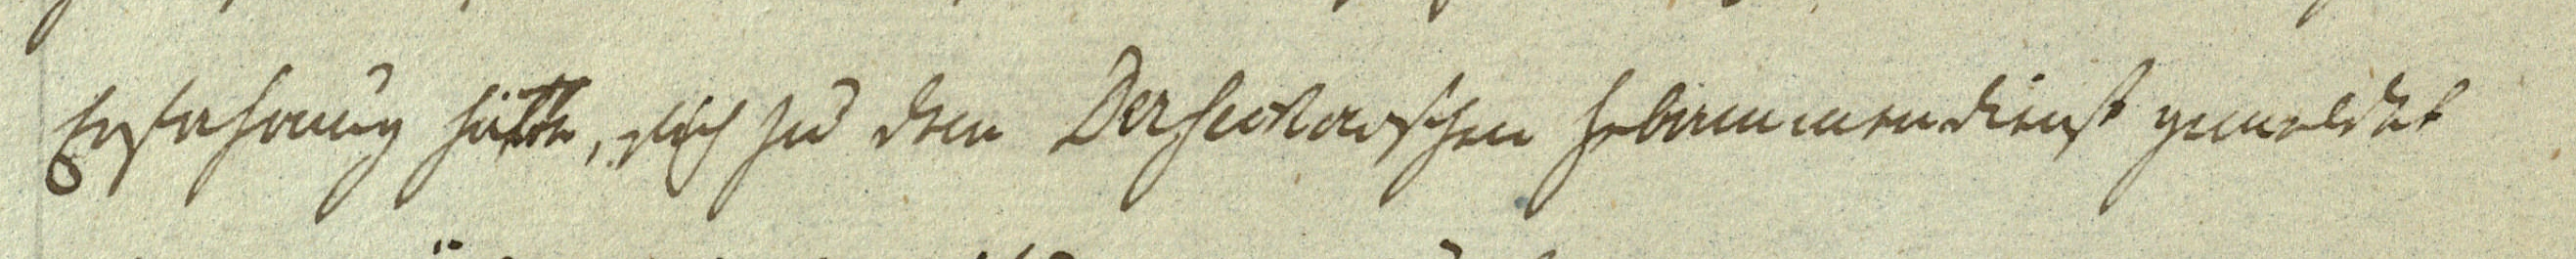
Erfahrung hätte, sich zu dem Dersekowschen Hebammendienst gemeldet
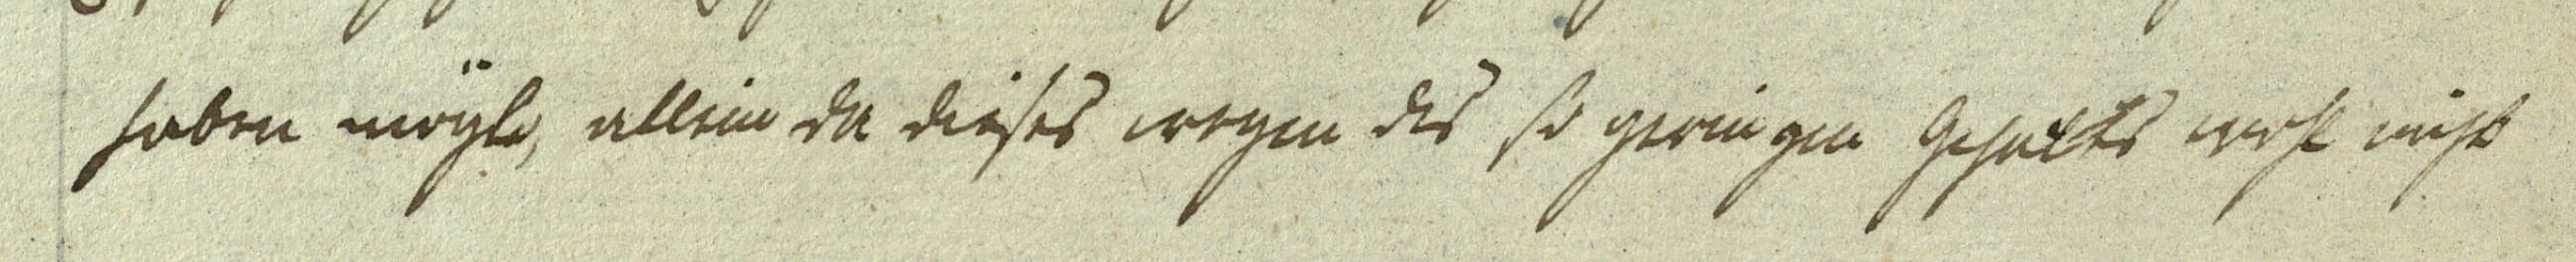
haben mögte, allen da dieses wegen des so geringen Gehalts wol nicht
